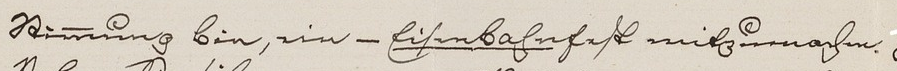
Stimmung bin, ein – Eisenbahnfest mitzumachen.
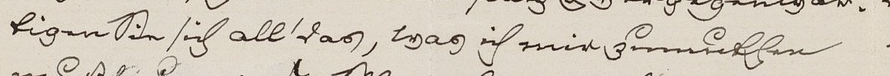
tigen Sie sich all'das, was ich mir zumuthen
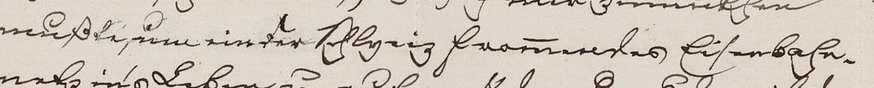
mußte, um ein der Schweiz frommendes Eisenbahn-
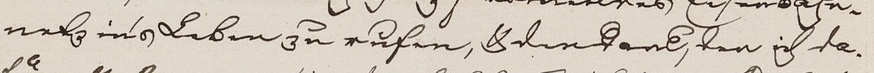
netz in's Leben zu rufen, & den Dank, den ich da-
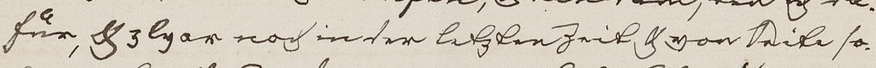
für, & zwar noch in der letzten Zeit & von Seite so-
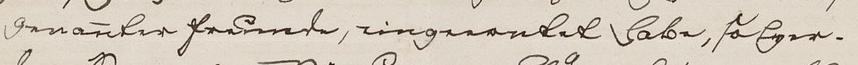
genannter Freunde, eingeerntet habe, so wer-
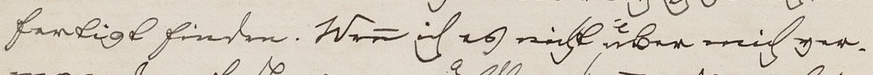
fertigt finden. Wenn ich es nicht über mich ver-
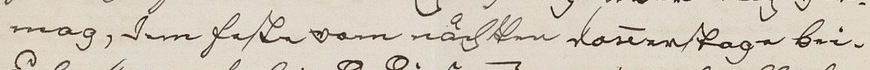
mag, dem Feste vom nächsten Donnerstage bei-
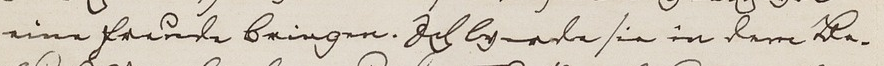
eine Freude bringen. Ich werde sie in dem Be-
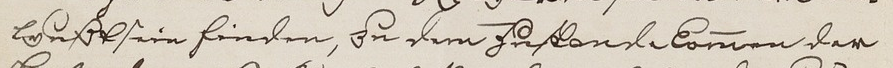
wußtsein finden, zu dem Zustandekommen der
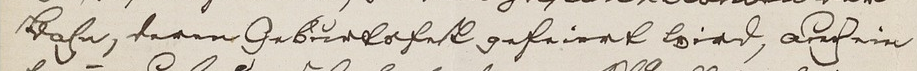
Bahn, deren Geburtsfest gefeiert wird, auch ein
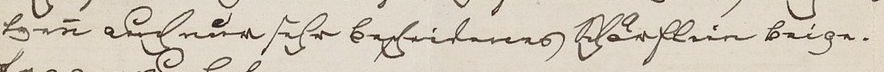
wenn auch nur sehr bescheidenes Schärflein beige-
